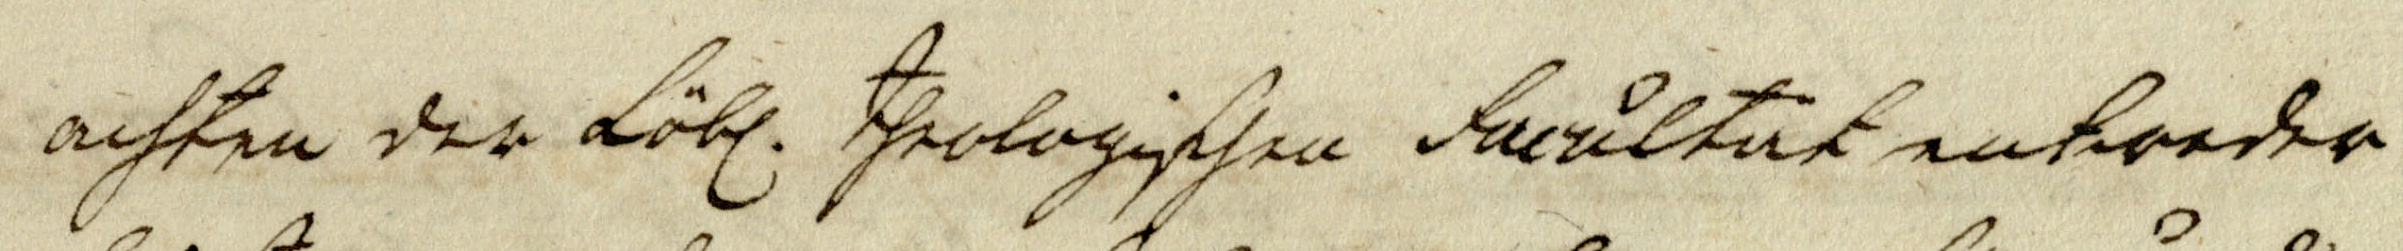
achten der Löbl. Theologischen Facultät entweder
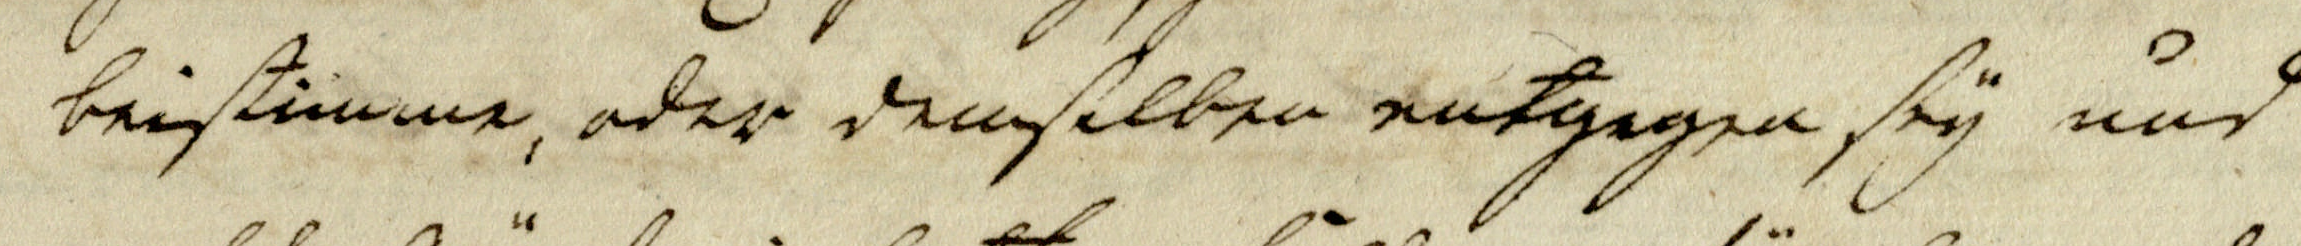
beistimme, oder demselben entgegen seÿ und
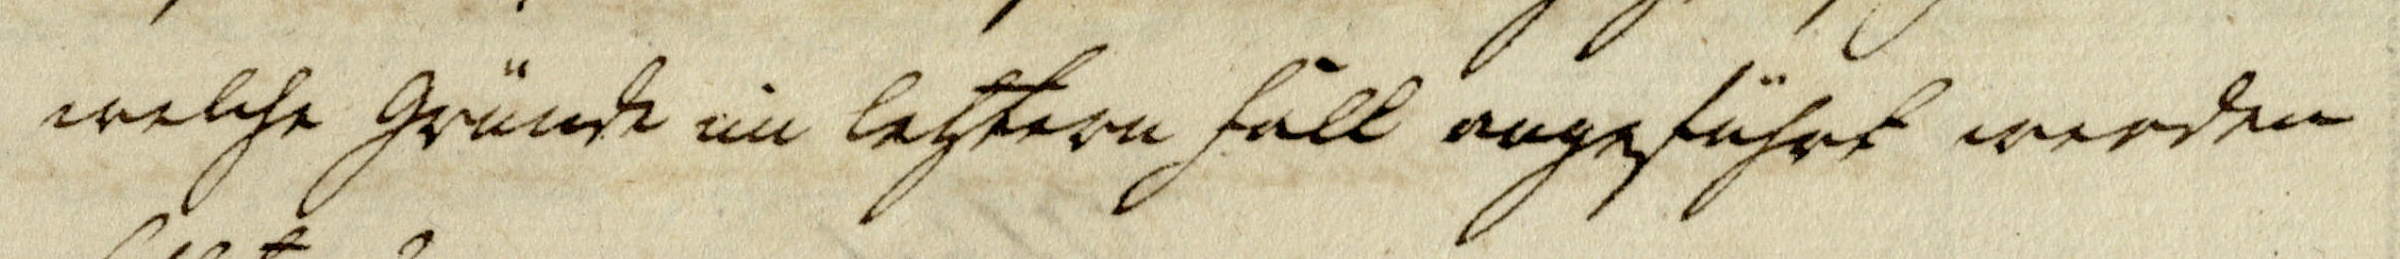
welche Gründe im letztern Fall angeführt werden
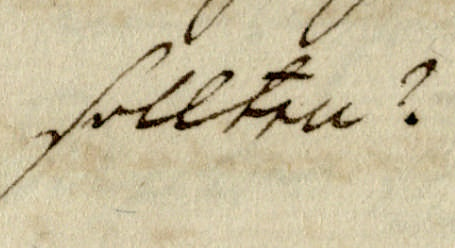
sollten?
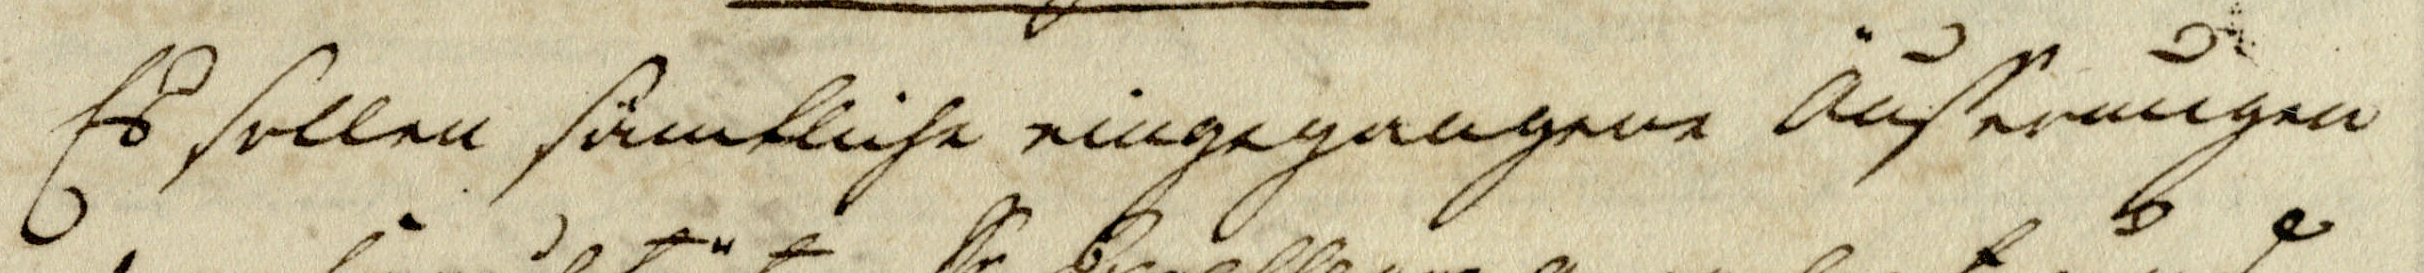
Es sollen sämtliche eingegangene Äusserungen
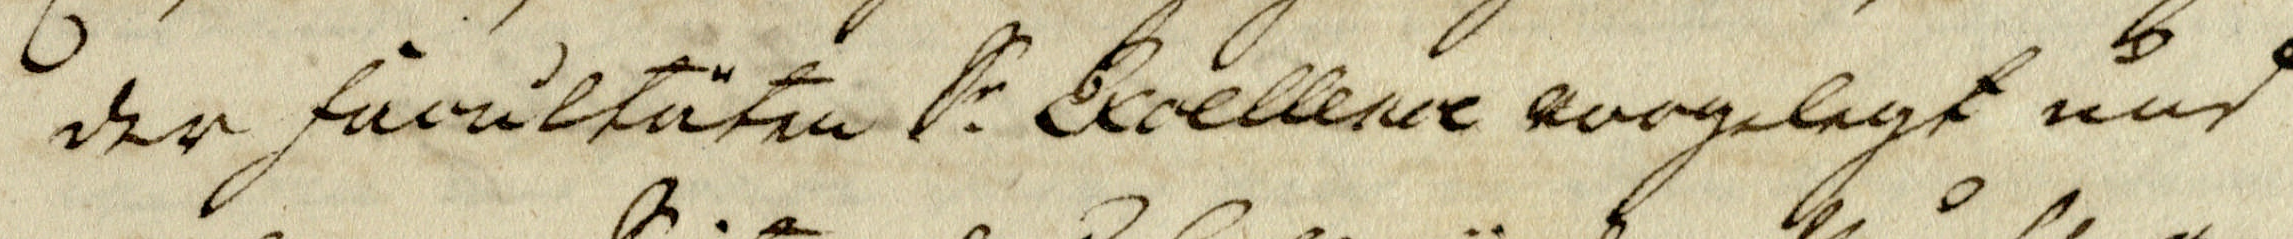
der Facultäten Sr Excellence vorgelegt und
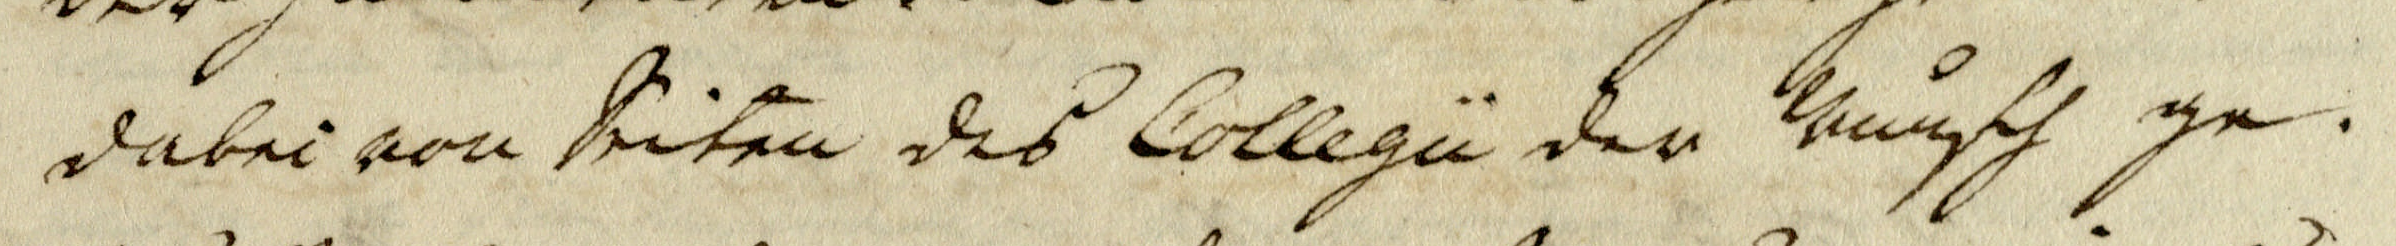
dabei von Seiten des Collegii der Wunsch ge¬
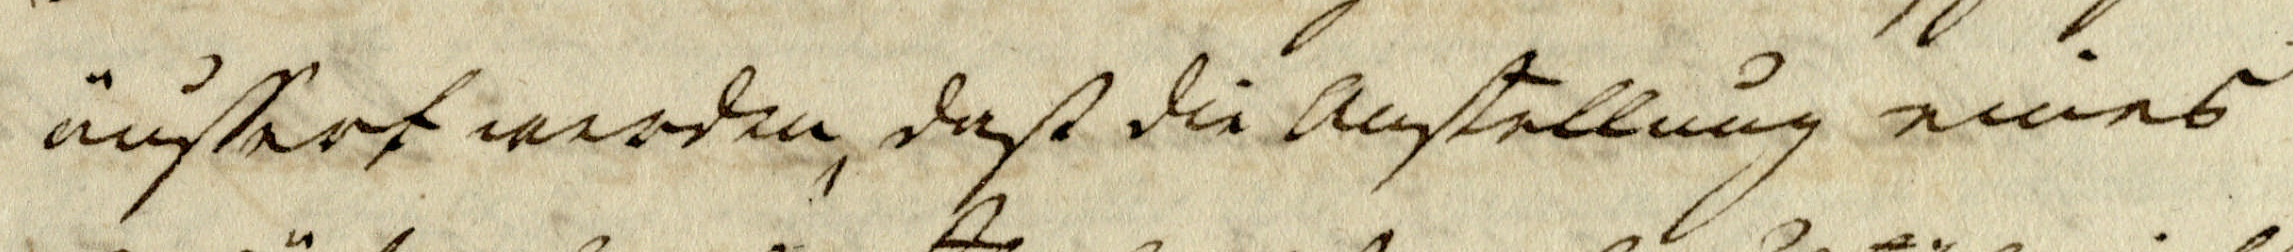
äussert werden, daß die Anstellung eines
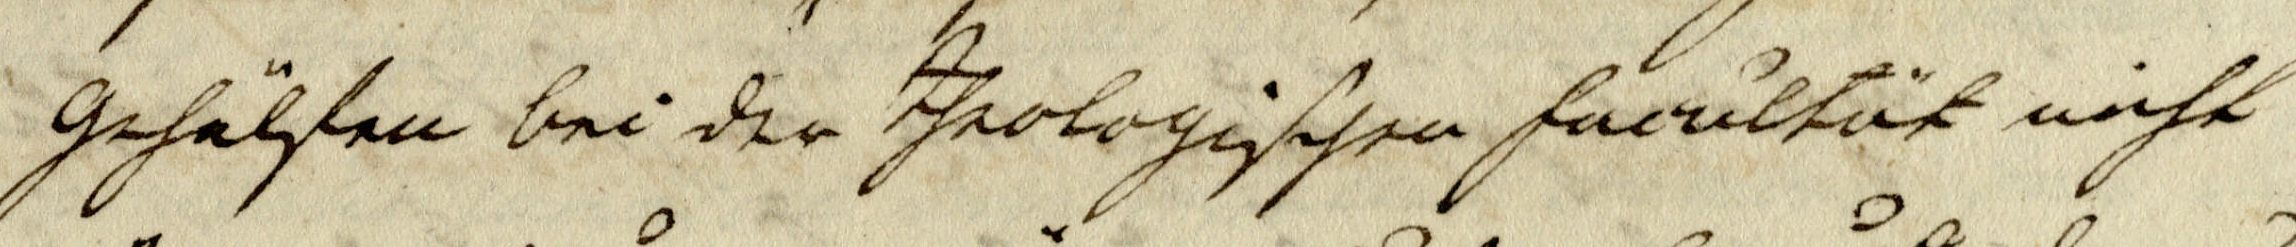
Gehülfen bei der Theologischen Facultät nicht
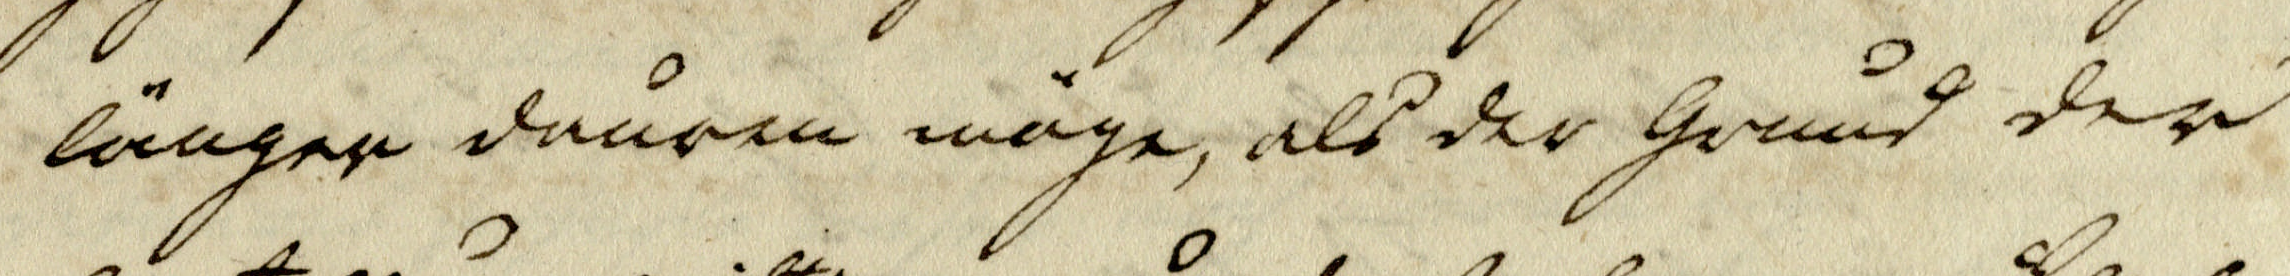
länger dauren möge, als der Grund der
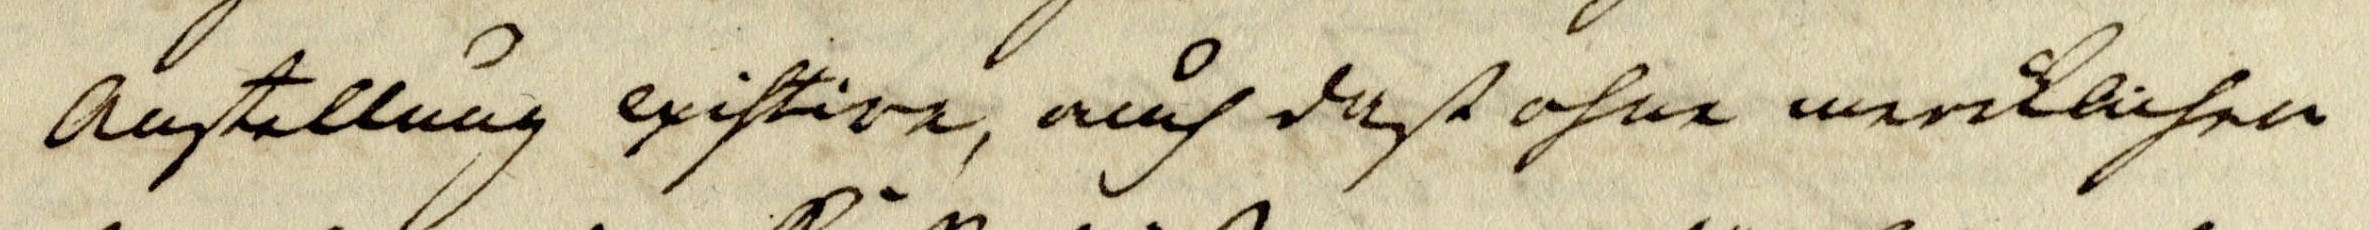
Anstellung existire, auch daß ohne mercklichen
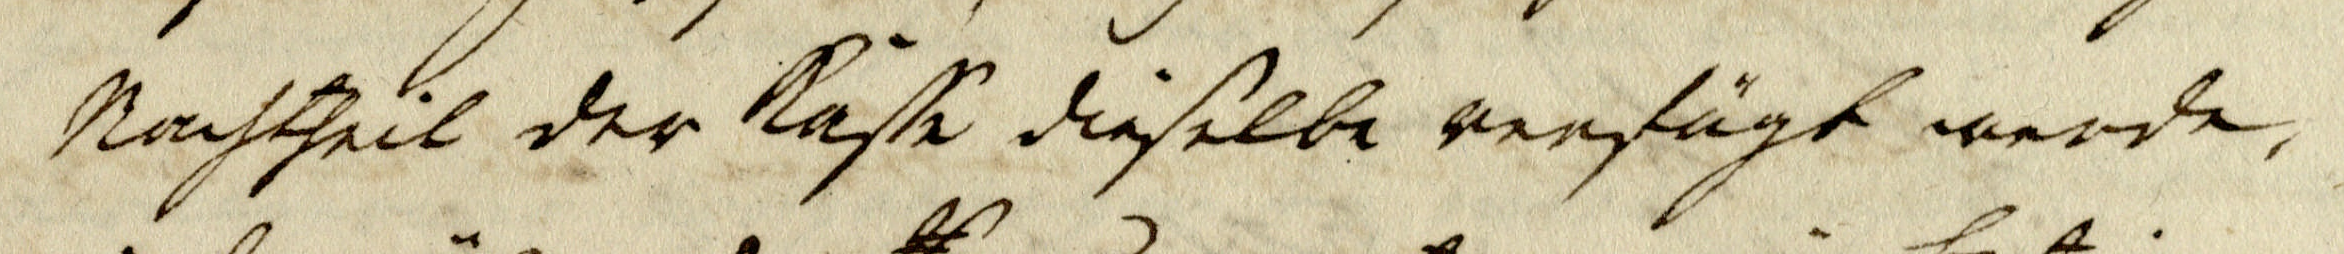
Nachtheil der Kasse dieselbe verfüget werde,
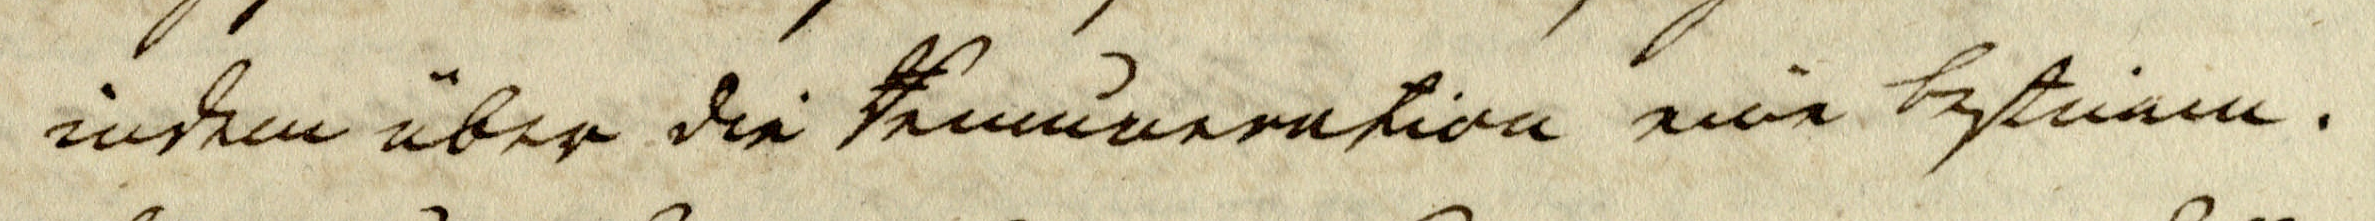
indem über die Remuneration eine bestimm¬
